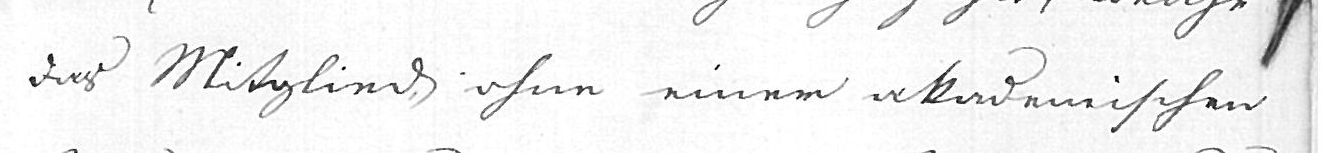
das Mitglied ohne einer akademischen
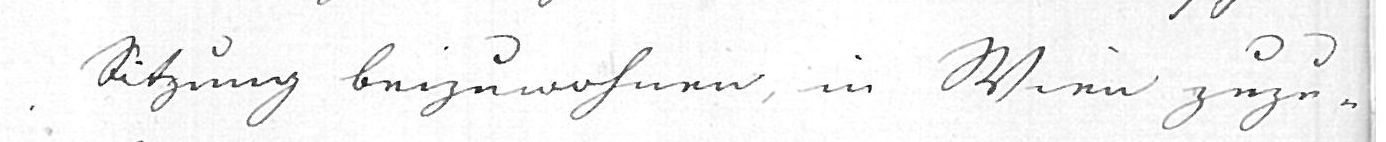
Sitzung beizuwohnen, in Wien zuzu-
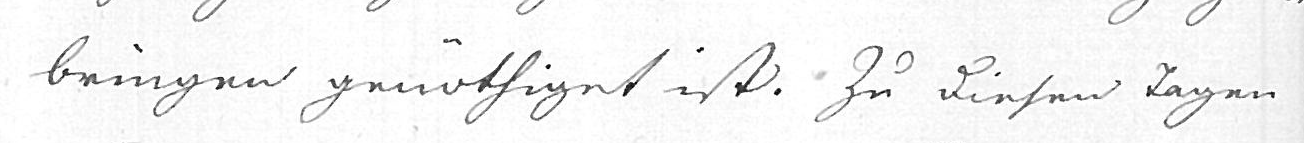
bringen genöthiget ist. Zu diesen Tagen
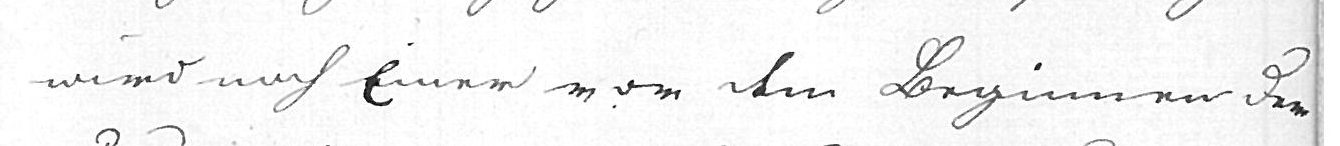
wird nach Einer vor dem Beginnen der
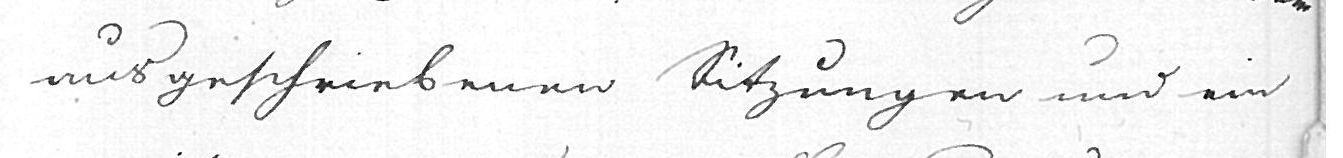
ausgeschriebenen Sitzungen und ein
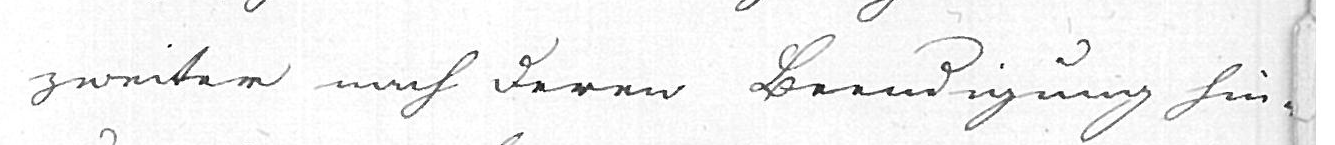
zweiter nach deren Beendigung hin-
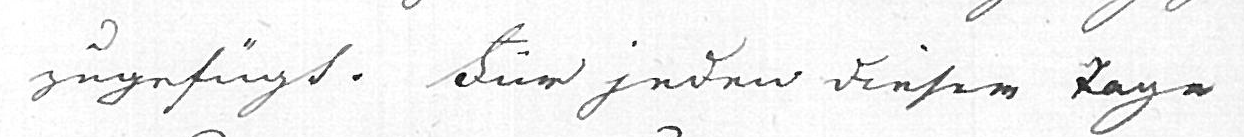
zugefügt. Für jeden dieser Tage
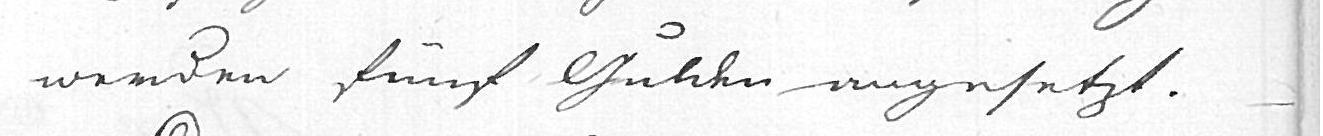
werden fünf Gulden angesetzt.
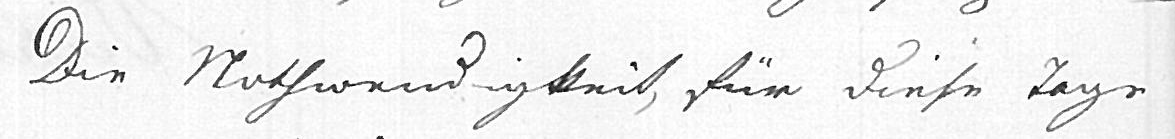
Die Nothwendigkeit, für diese Tage
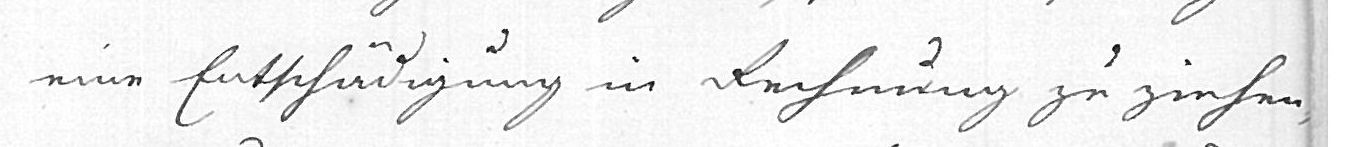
eine Entschädigung in Rechnung zu ziehen,
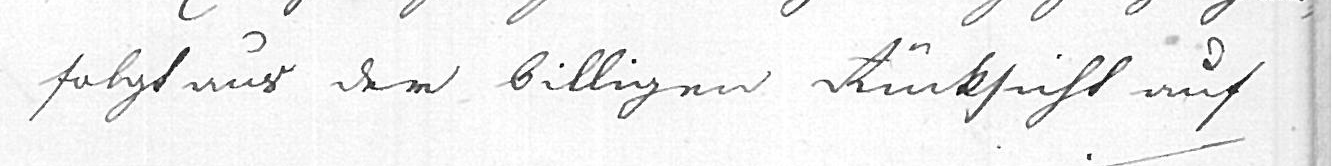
folgt aus der billigen Rücksicht auf
